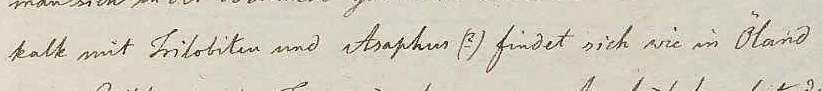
kalk mit Trilobiten und Asaphus findet sich wie in Öland
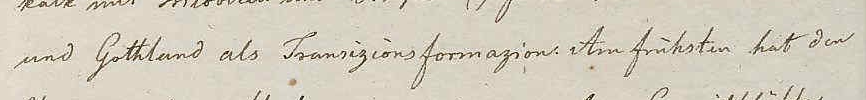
und Gothland als Transizionsformazion. Am frühesten hat den
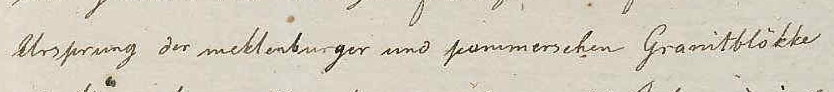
Ursprung der meklenburger und pommerschen Granitblökke
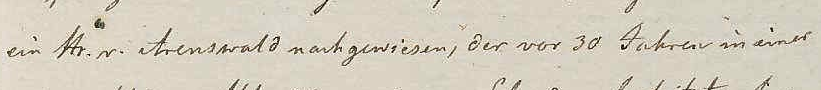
ein Hr. v. Arenswald nachgewiesen, der vor 30 Jahren in einer
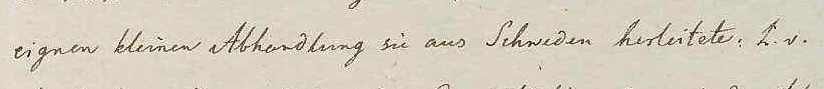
eignen kleinen Abhandlung sie aus Schweden herleitete: L. v.
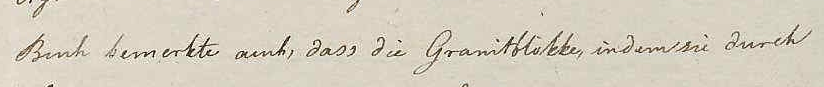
Buch bemerkte auch, dass die Granitblökke, indem sie durch
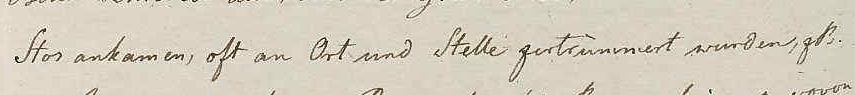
Stos ankamen, oft an Ort und Stelle zertrümmert wurden, zB.
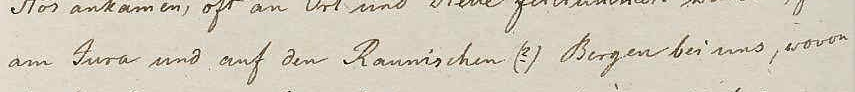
am Jura und auf den Raunischen Bergen bei uns, wovon
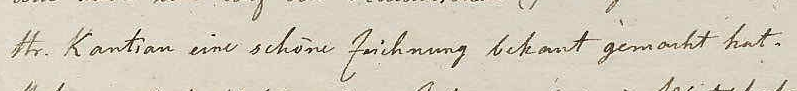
Hr. Kantian eine schöne Zeichnung bekant gemacht hat.
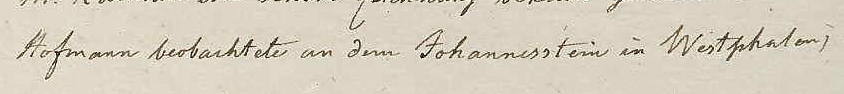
Hofmann beobachtete an dem Johannesstein in Westphalen,
